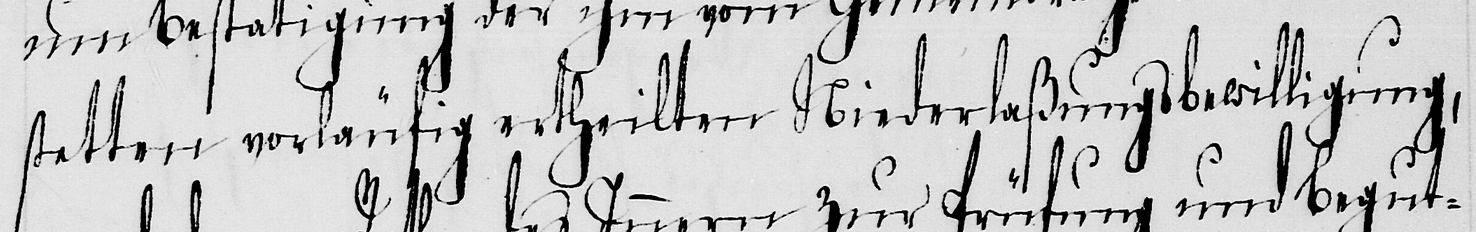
stetten vorläufig erhteilten Niederlaßungsbewilligung,
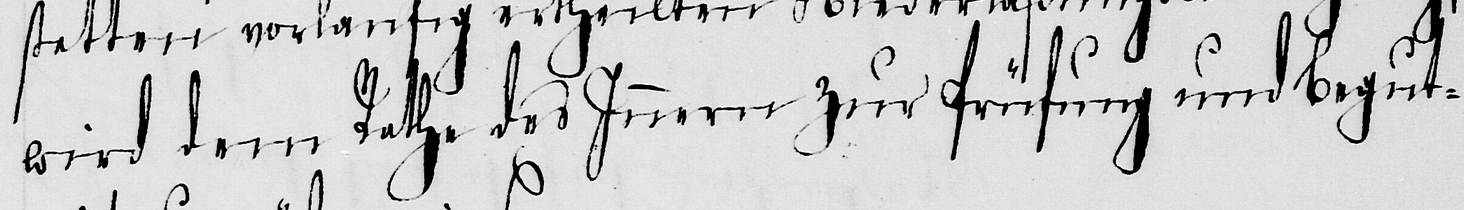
wird dem Rathe des Innern zur Prüfung und Begut¬
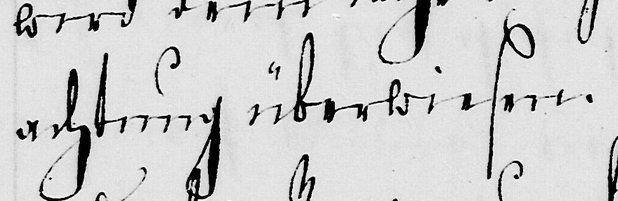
achtung überwiesen.
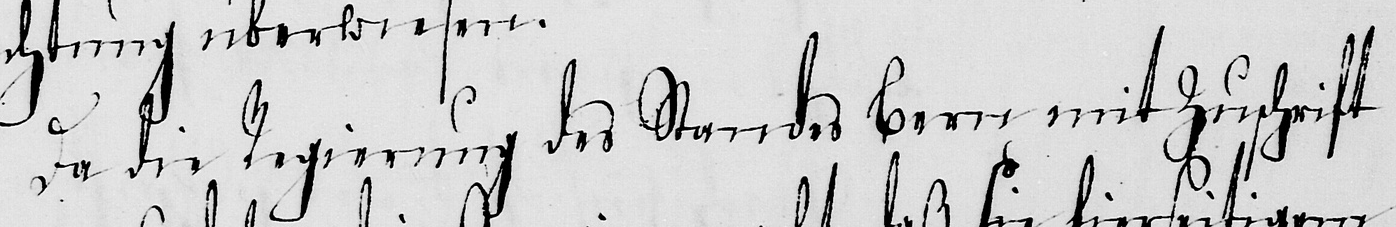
Da die Regierung des Standes Bern mit Zuschrift
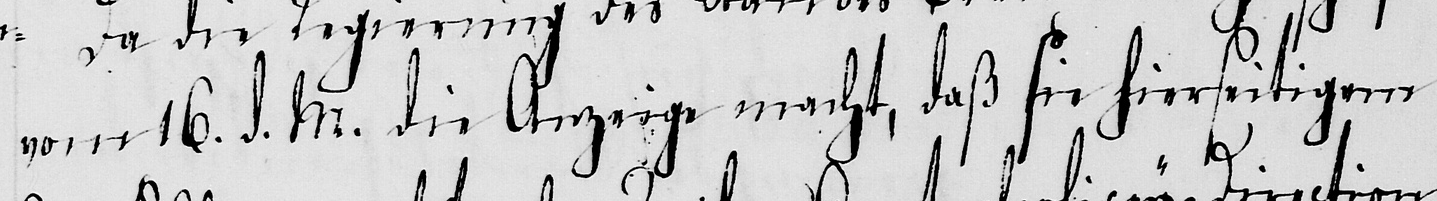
vom 16. d. M. die Anzeige macht, daß sie hierseitigem
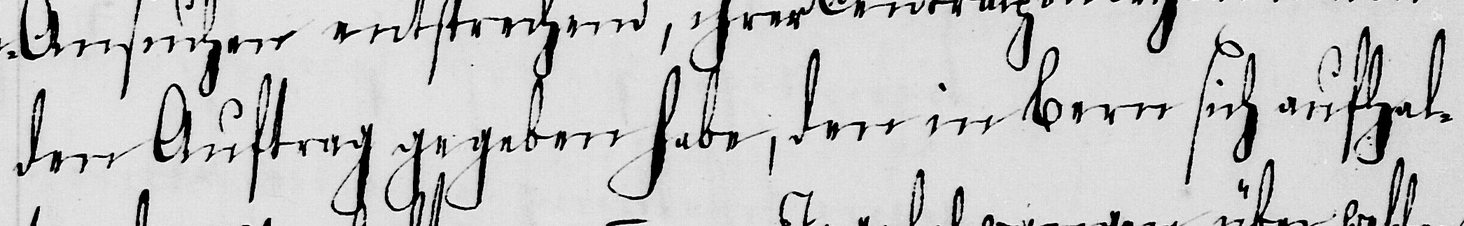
den Auftrag gegeben habe, den in Bern sich aufhal¬
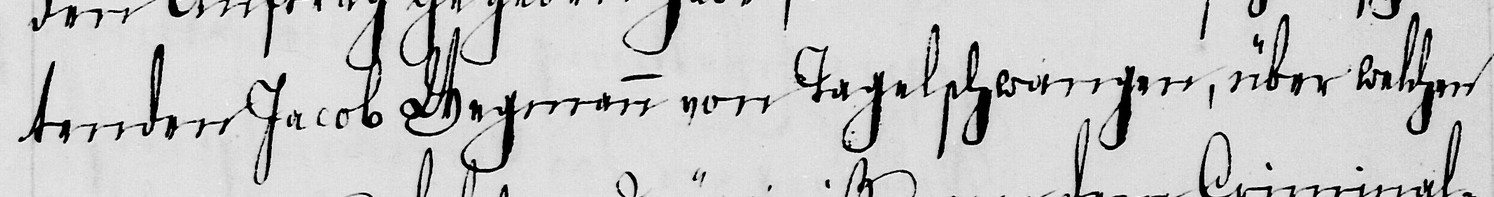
tenden Jacob Wegmann von Tagelschwangen, über welchen
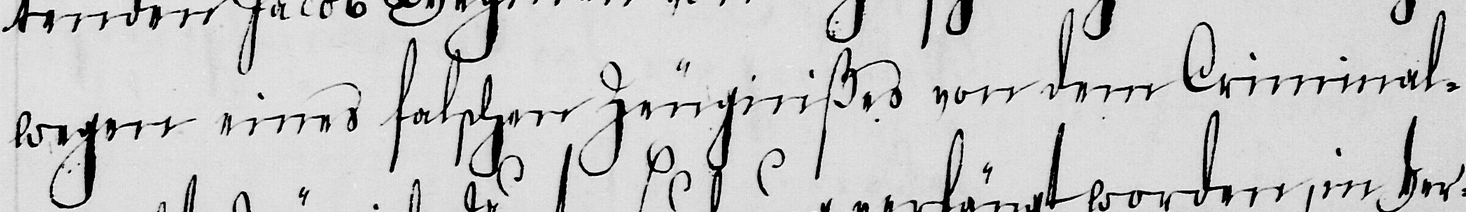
wegen eines falschen Zeugnißes von dem Criminal¬
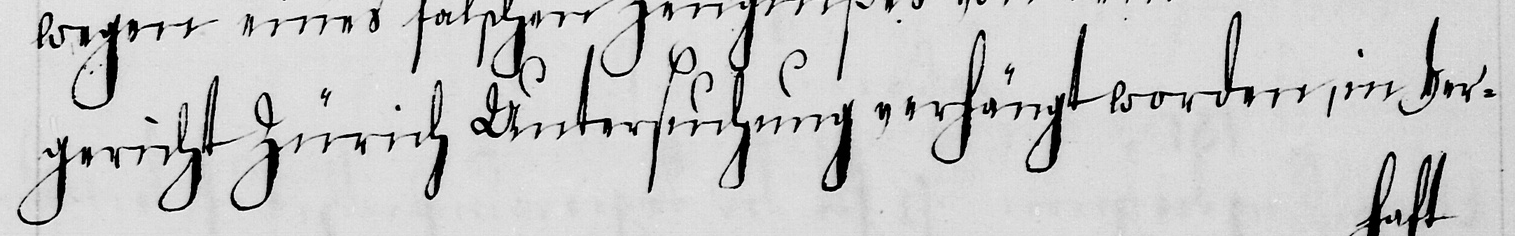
gericht Zürich Untersuchung verhängt worden, in Ver-
